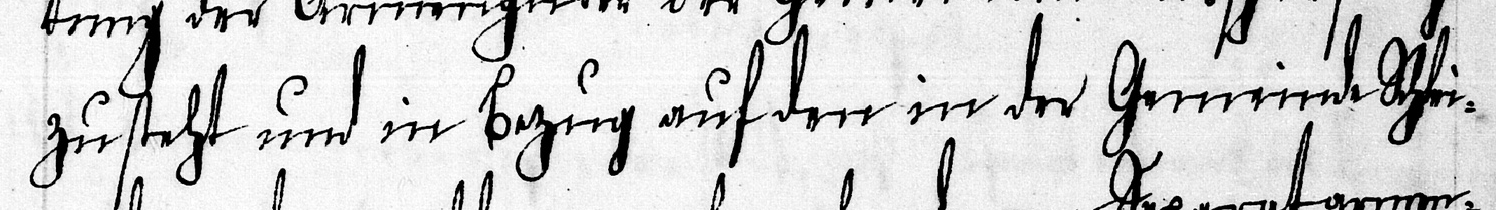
zusteht und in Bezug auf den in der Gemeinde Schle¬
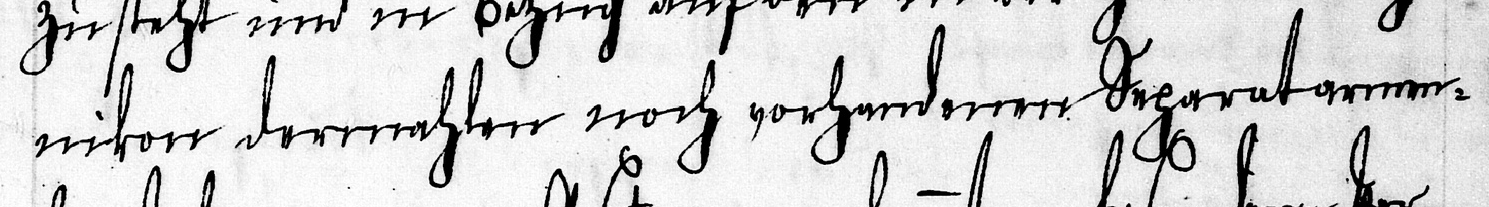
inikon dermahlen noch vorhandenen Separatarmen¬
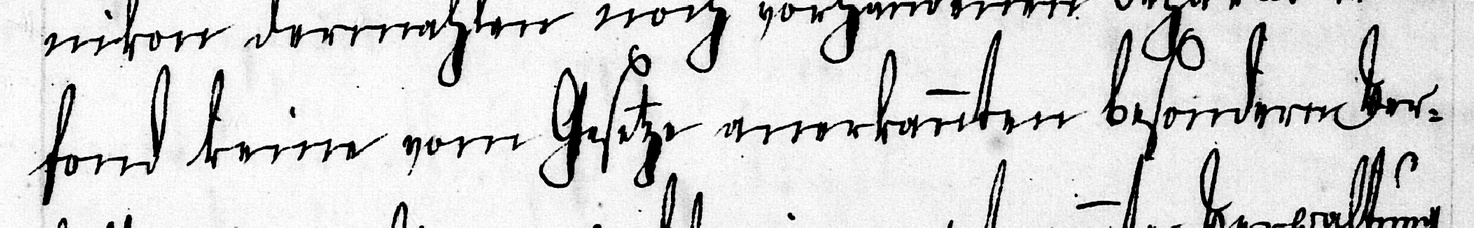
fond keine vom Gesetze anerkannten besondern Ver¬
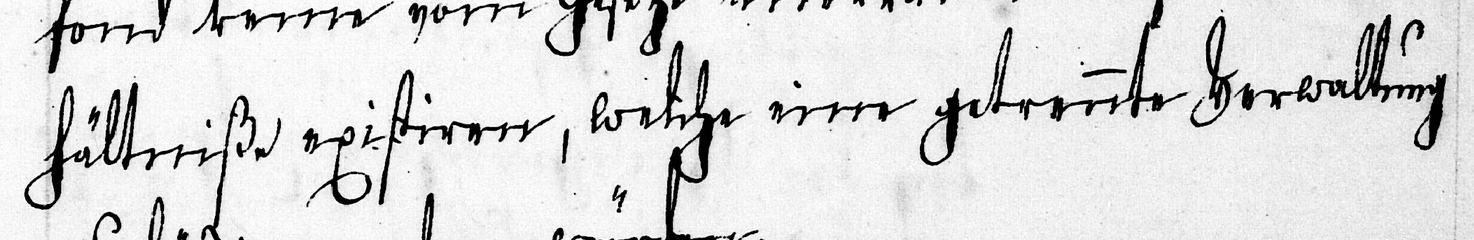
hältniße existiren, welche eine getrennte Verwaltung
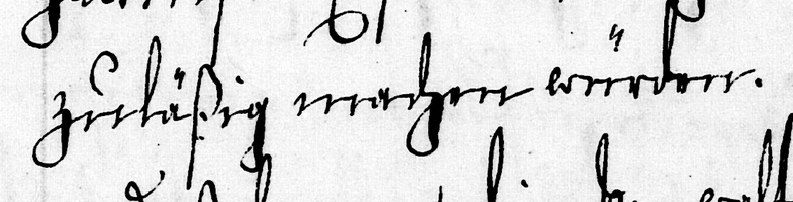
zuläßig machen würden.
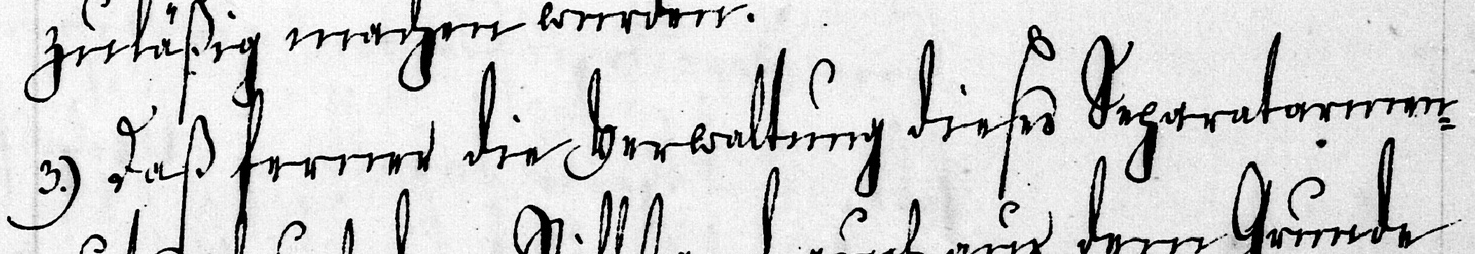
3.) Daß ferner die Verwaltung dieses Separatarmen¬
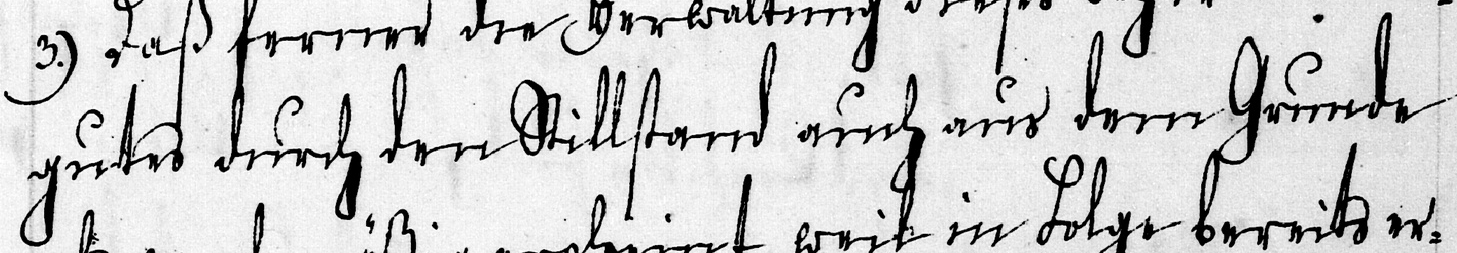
gutes durch den Stillstand auch aus dem Grunde
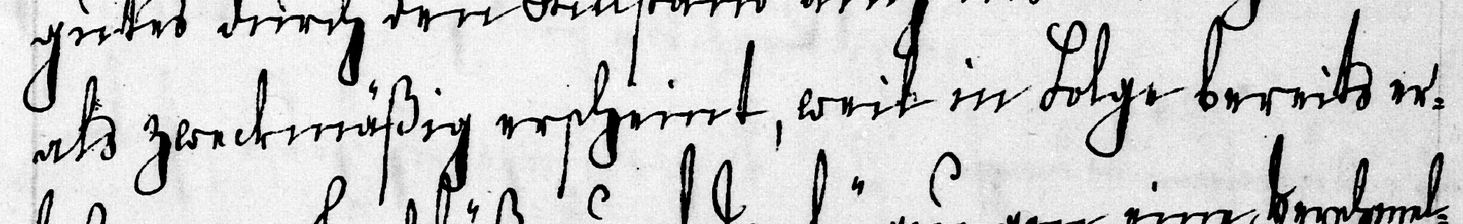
als zweckmäßig erscheint, weil in Folge bereits er¬
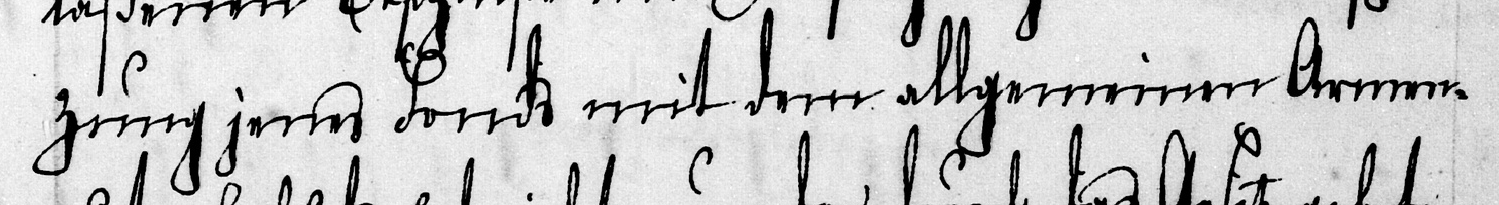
zung jenes Fonds mit dem allgemeinen Armen¬
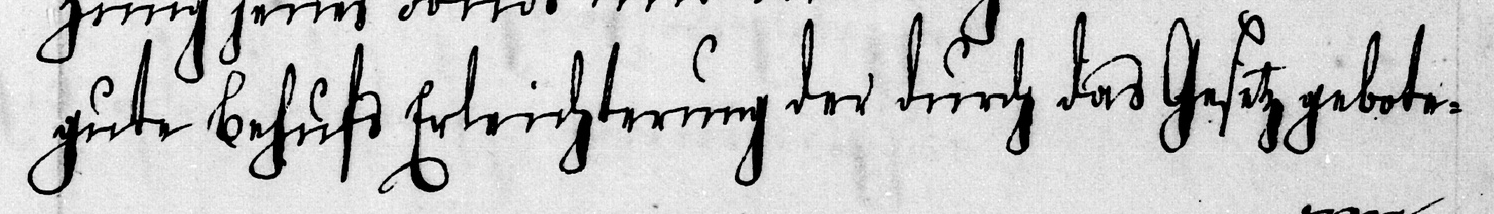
gute Behufs Erleichterung der durch das Gesetz gebote-
